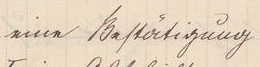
eine Bestätigung
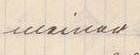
meiner
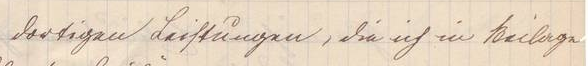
dortigen Leistungen, die ich in Beilage
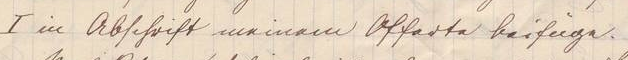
I in Abschrift meinem Offerte beifüge.
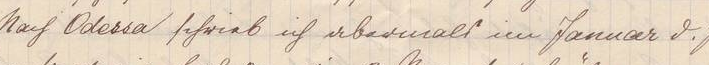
Nach Odessa schrieb ich abermals im Januar d.
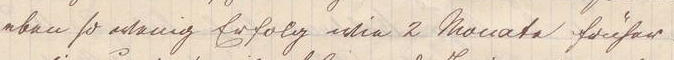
eben so wenig Erfolg wie 2 Monate früher.
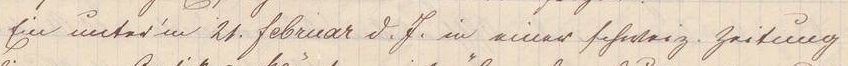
Ein unter'm 21. Februar d. J. in einer schweiz. Zeitung
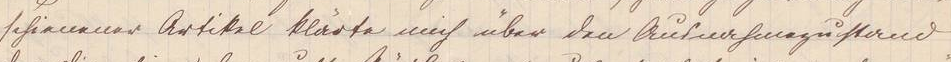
schienener Artikel klärte mich über den Ausnahmezustand
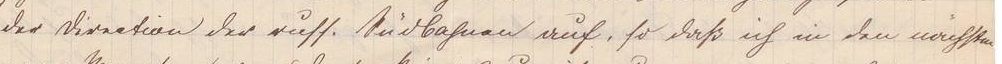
der Direction der russ. Südbahnen auf, so daß ich in den nächsten
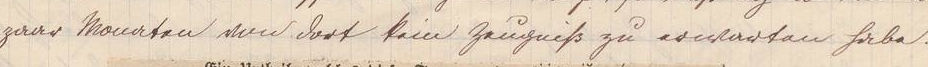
paar Monaten von dort kein Zeugnis zu erwarten habe.
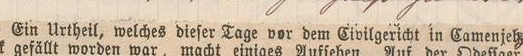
Ein Urtheil, welches dieser Tage vor dem Civilgericht in Camenjelz
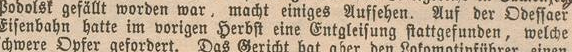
Eisenbahn hatte im vorigen Herbst eine Entgleisung stattgefunden, welche
